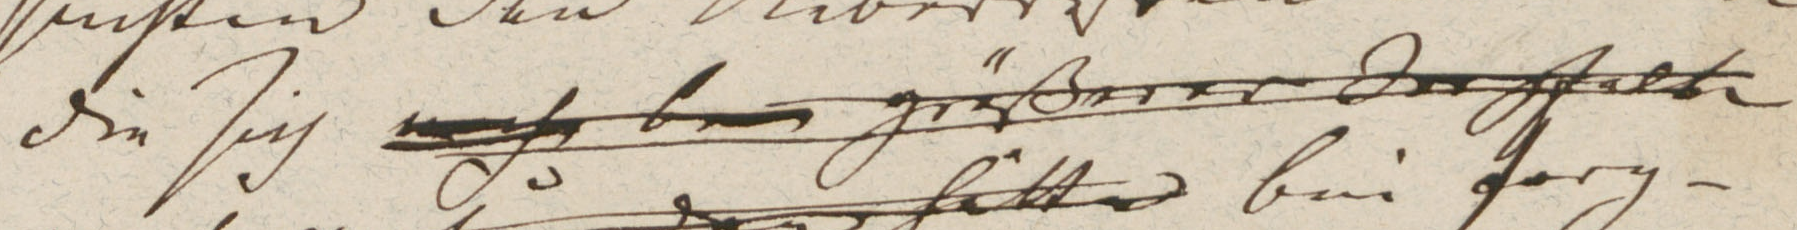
die sich noch bei grösserer Sorgfalt
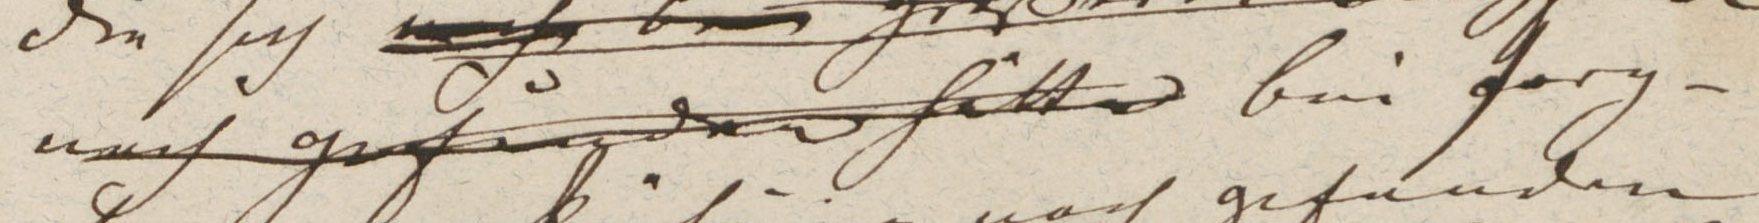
noch gefunden hätte bei sorg-
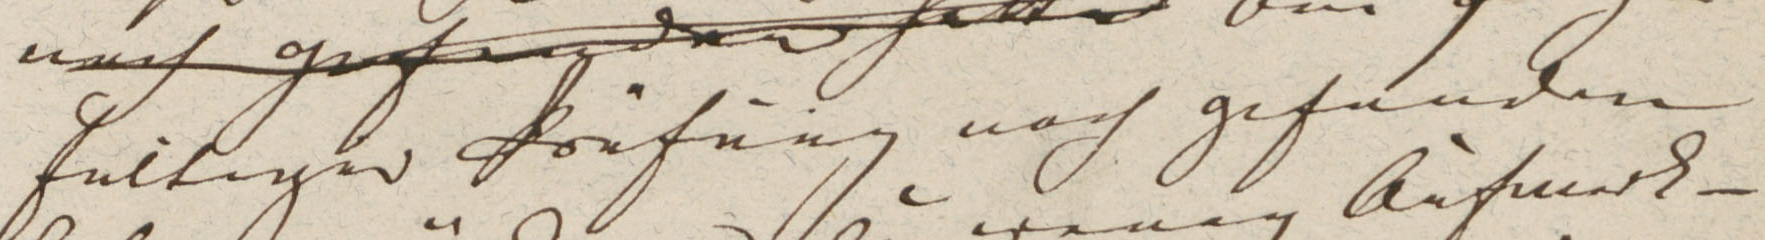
fältiger Prüfung noch gefunden
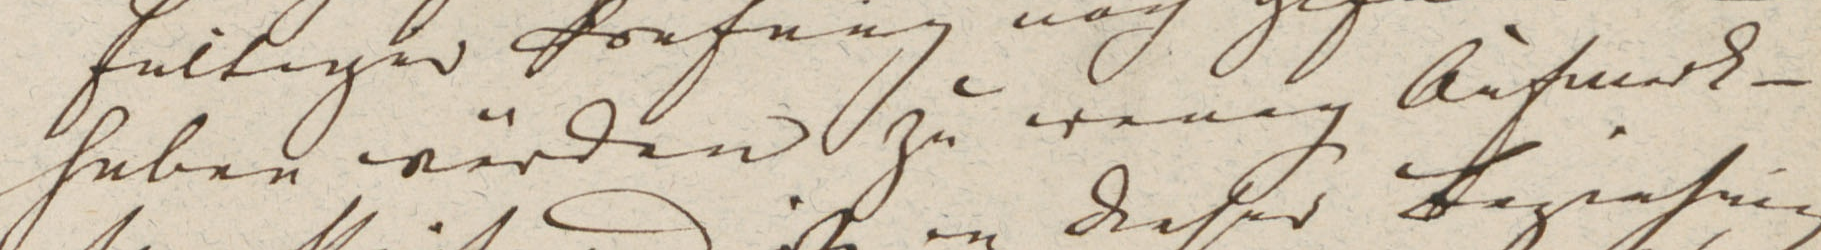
haben würden zu wenig Aufmerk-
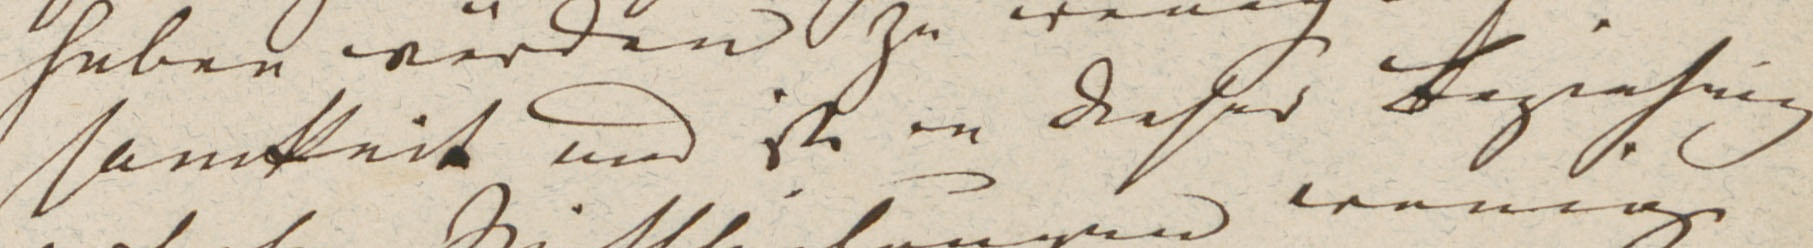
samkeit und ist in dieser Beziehung
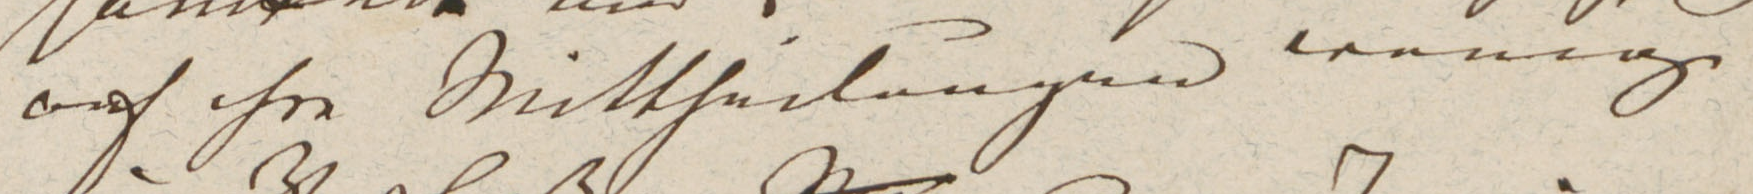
auf ihre Mittheilungen wenig
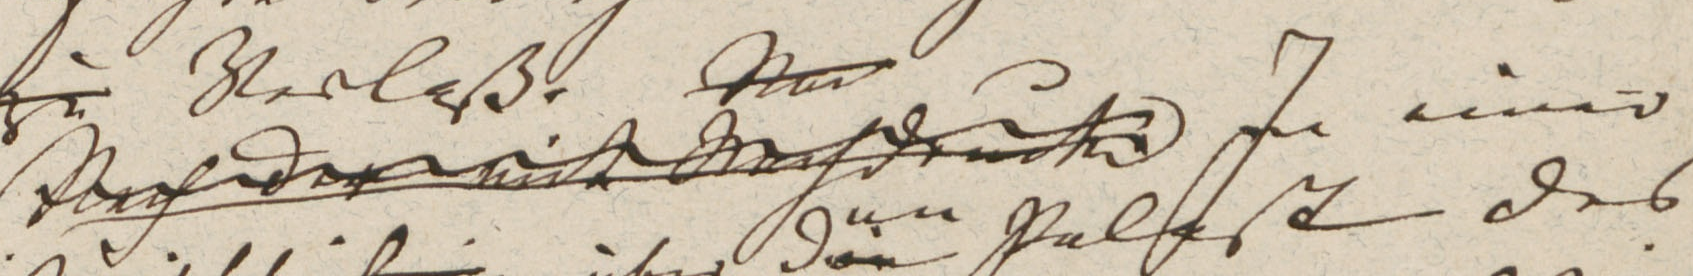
Nach der mit Nachdruck Nac In einer
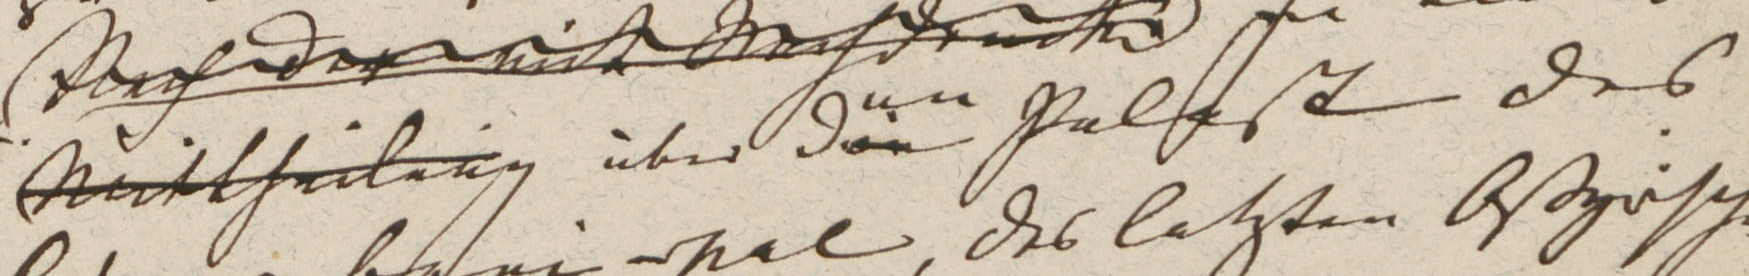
Mittheilung über dieen Palast des
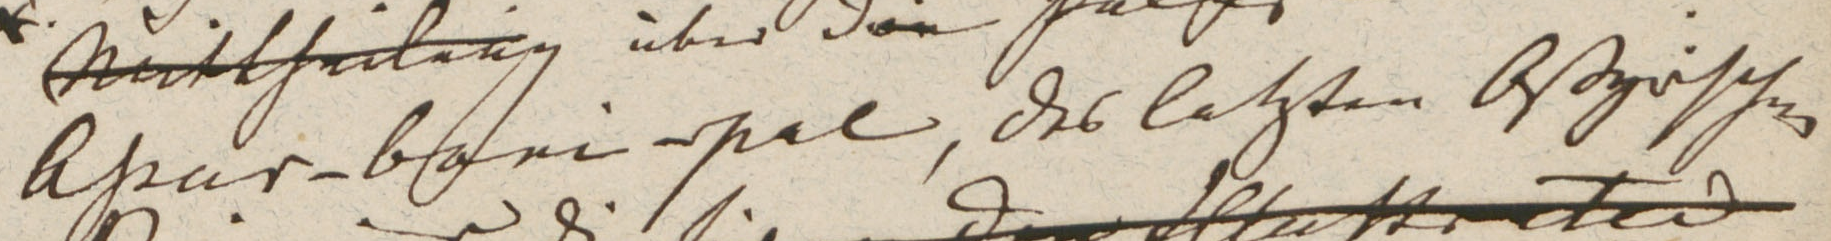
Assur-bari-pal, des letzten Assyrischen
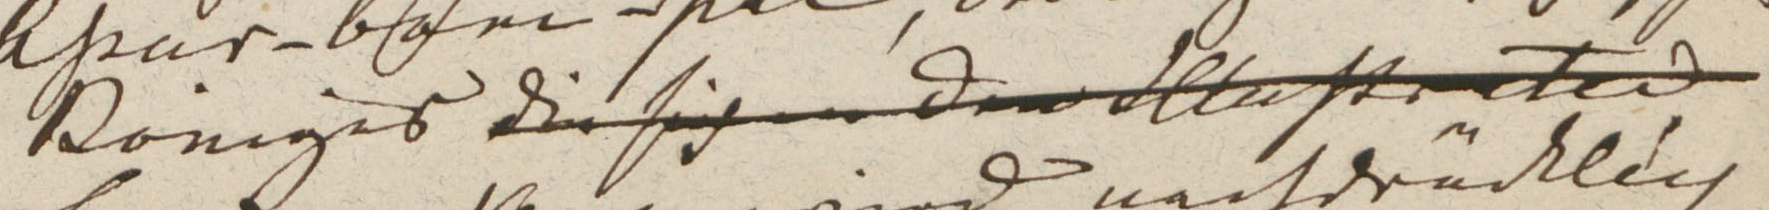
Königes die sich in den Illustrated
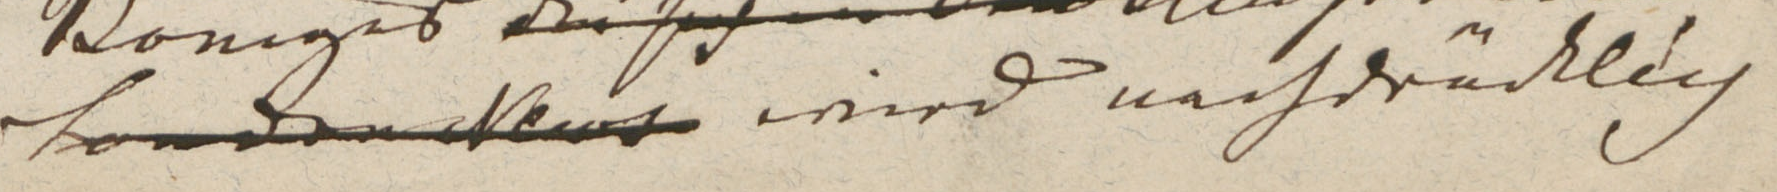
London News wird nachdrücklich
